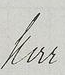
Freund
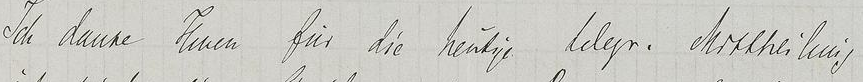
Ich danke Ihnen für die heutige telegr. Mittheilung.
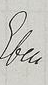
Eben
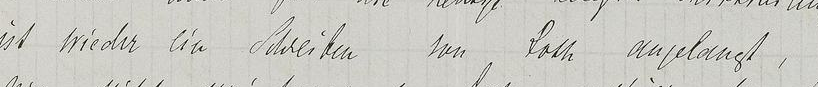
ist wieder ein Schreiben von Roth angelangt,
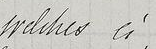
welches ei-
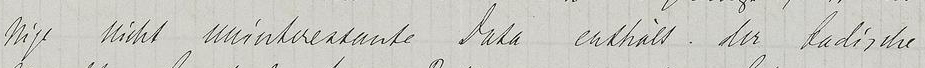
nige nicht uninteressante Data enthält. Der badische
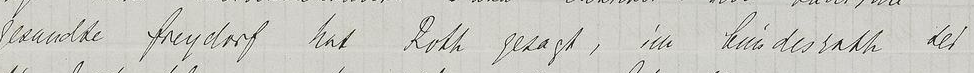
Gesandte Freydorf hat Roth gesagt, im Bundesrath sei
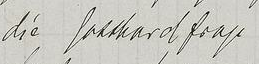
die Gotthardfrage
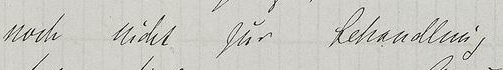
noch nicht zur Behandlung
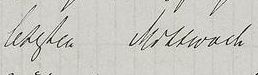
letzten Mittwoch
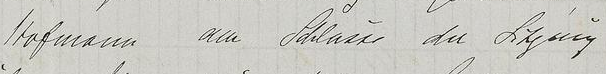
Hofmann am Schlusse der Sitzung
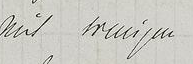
mit wenigen
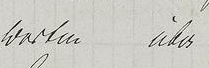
Worten über
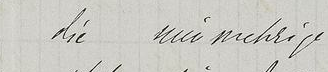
die nunmehrige
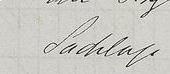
Sachlage
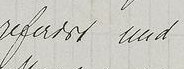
referirt und
